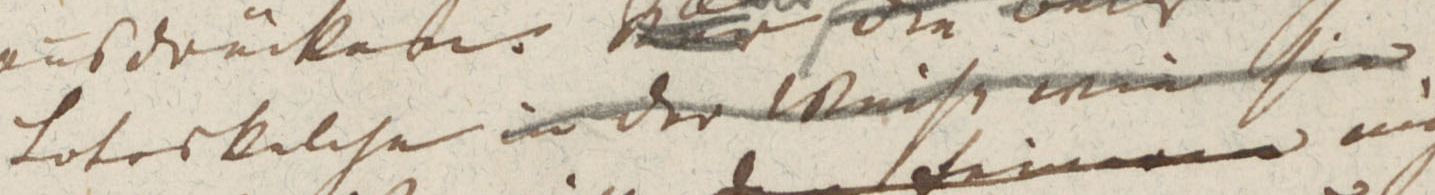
Lotoskelche in der Weise wie sie
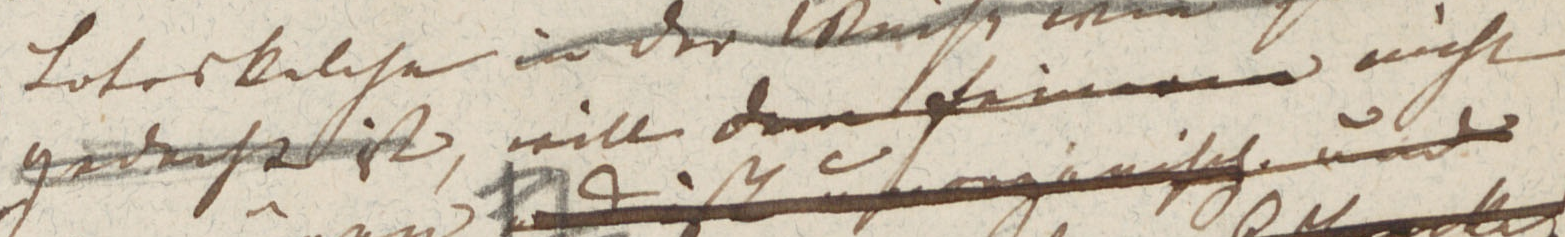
gedacht ist, will den feineren nicht
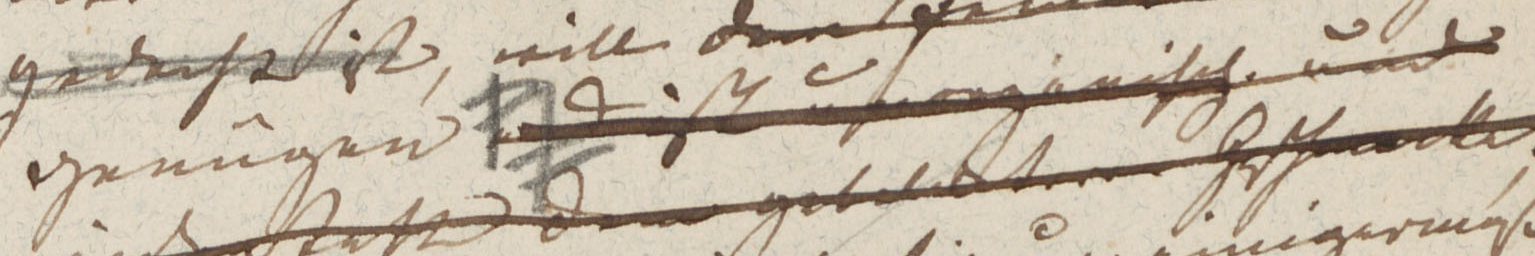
genügen % und ist unorganisch und
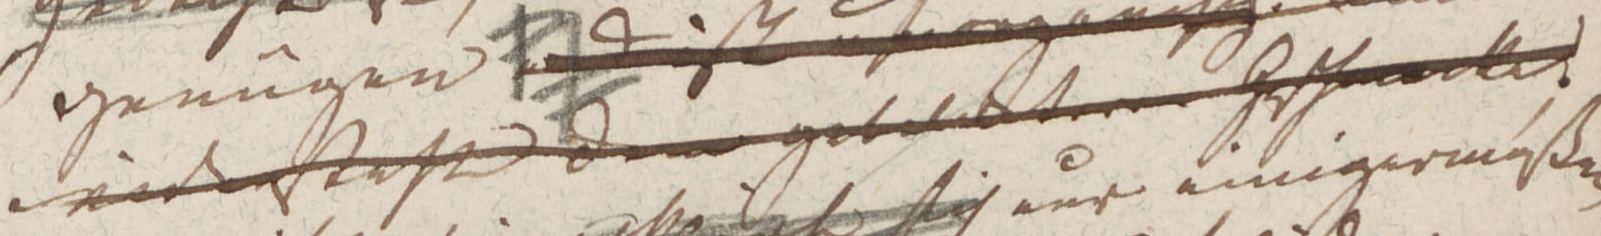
widersteht dem gebildeten Geschmacke; %
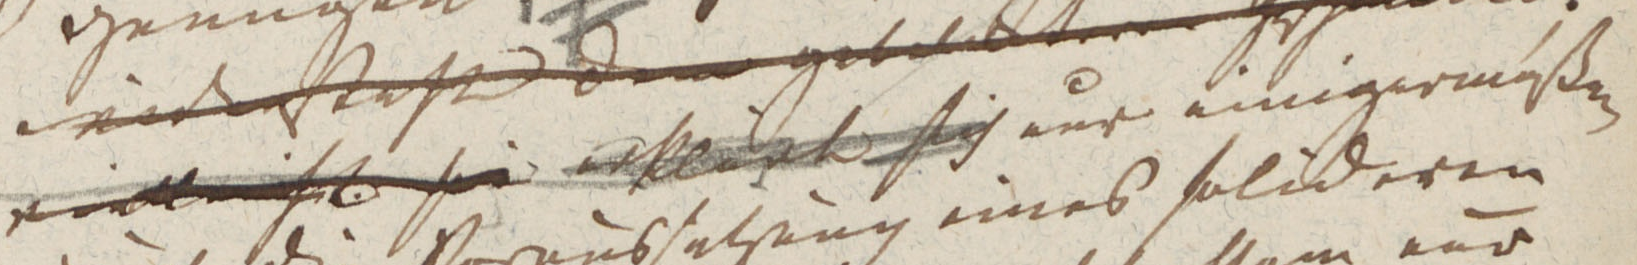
vielleicht sie erklärt sich nur einigermassen
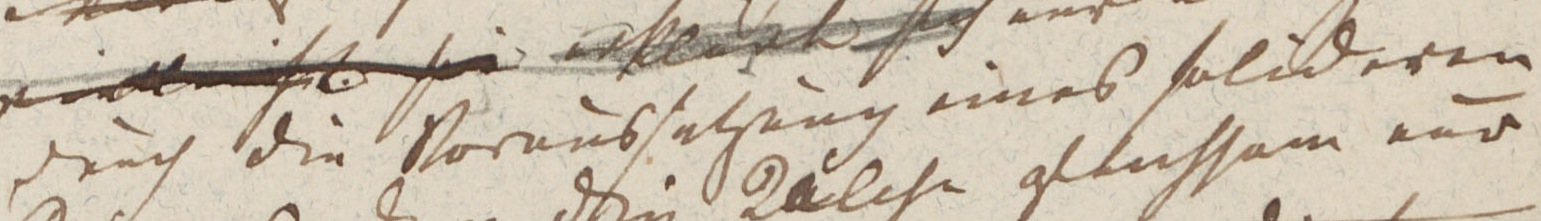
durch die Voraussetzung eines solideren
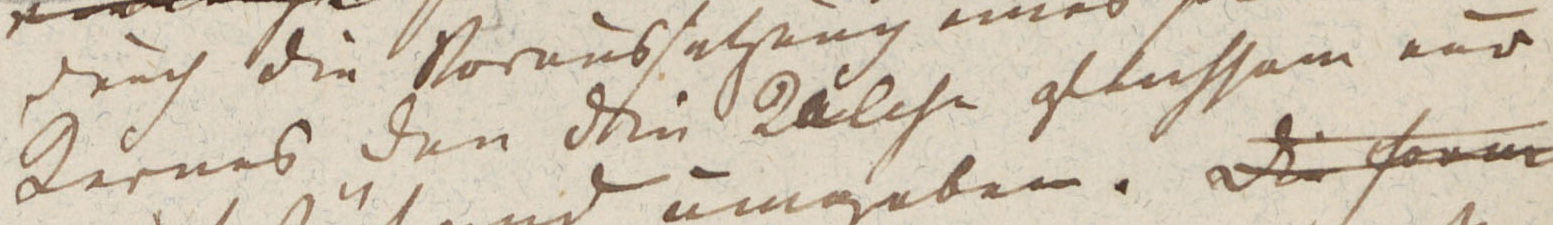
Kernes den die Kelche gleichsam nur
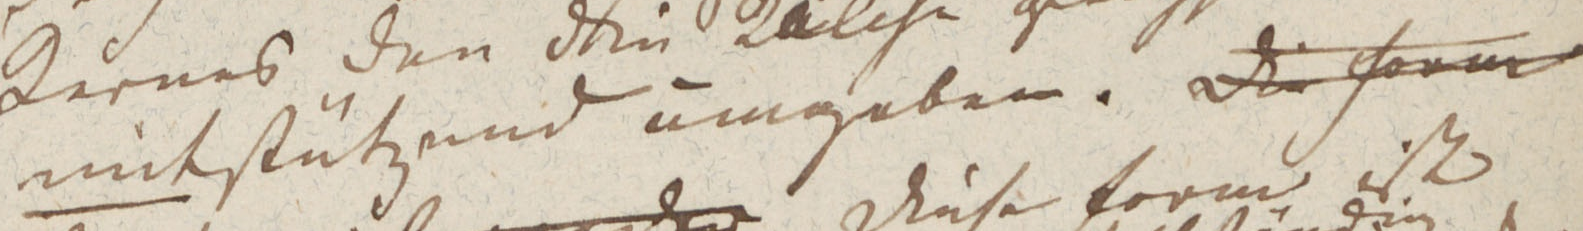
mitstützend umgeben. Die Form
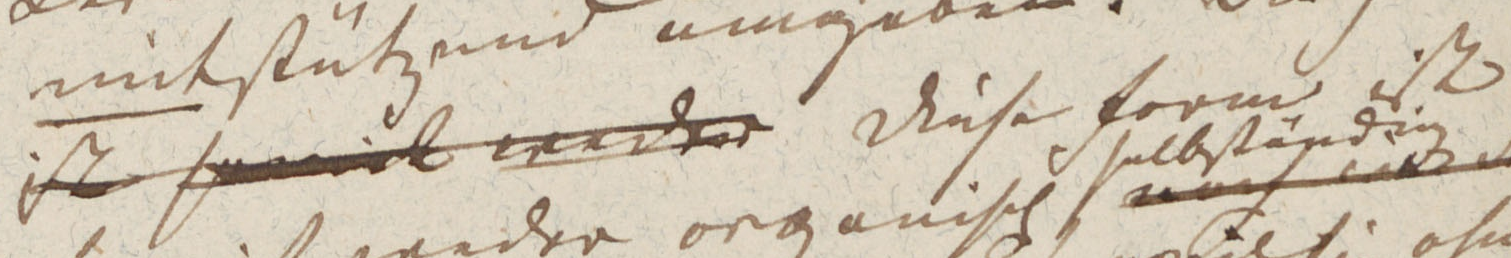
ist somit weder Diese Form ist
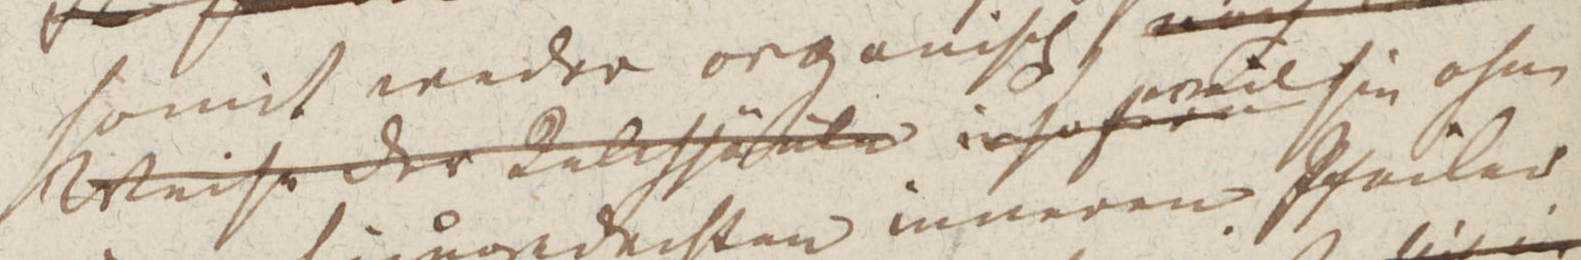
Weise der Kelchsäule insofern weil sie ohne
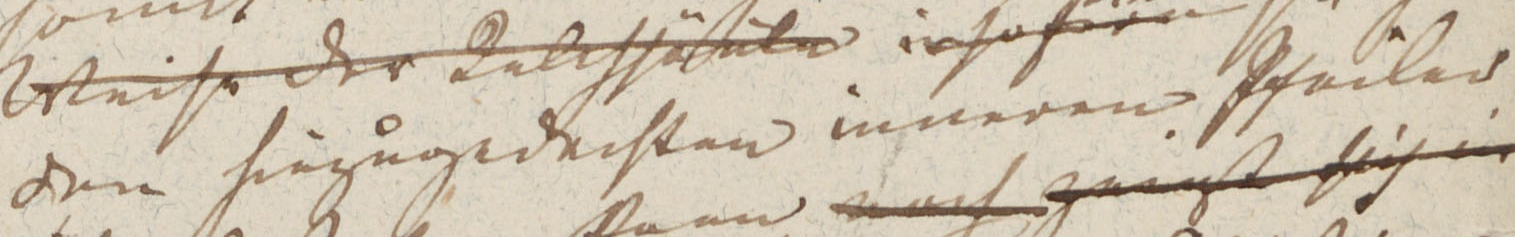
den hinzugedachten inneren Pfeiler
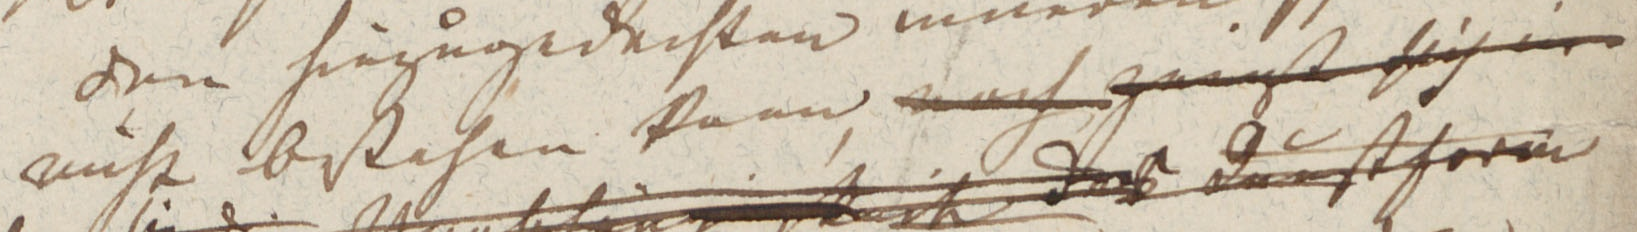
nicht bestehen kann, noch zeigt sich in
